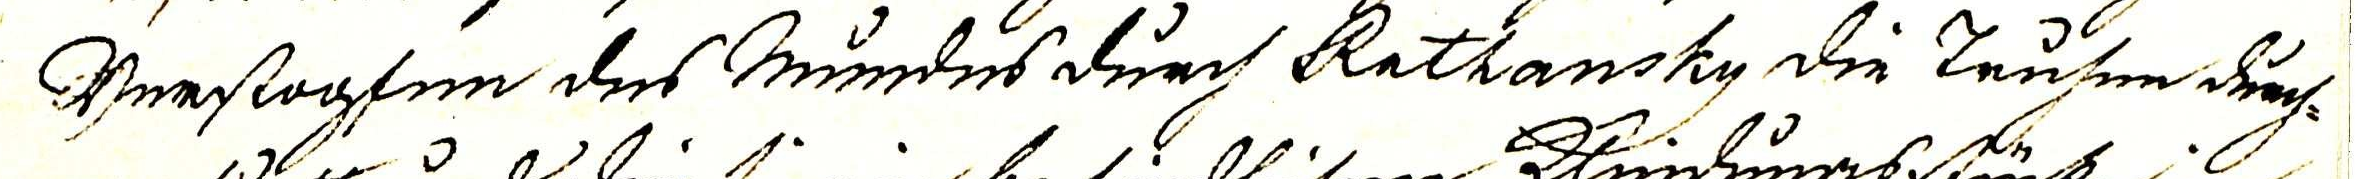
Verstopfen des Mundes durch Rathausky die Truhen durch¬
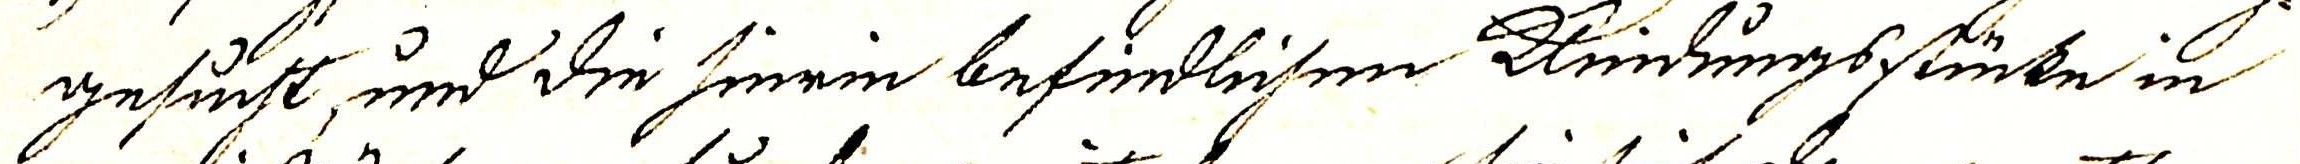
gesucht, und die hierein befindlichen Kleidungsstücke in
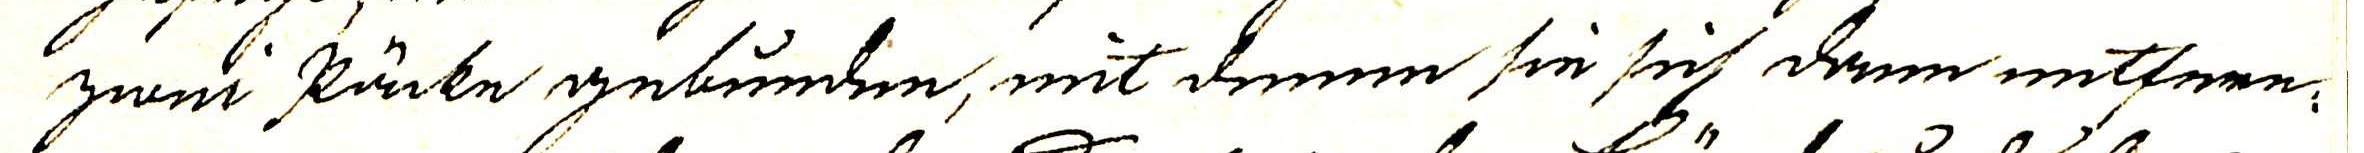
zwei Päcke gebunden, mit denen sie sich dann entfern¬
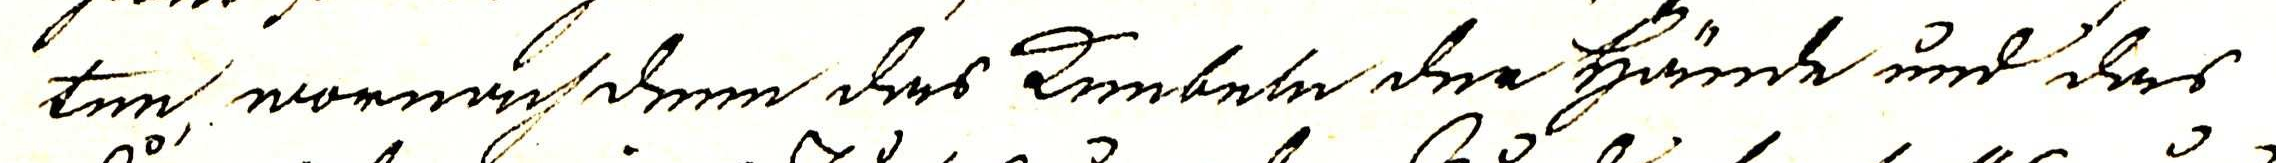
ten, wornach denn das Knebeln der Hände und das
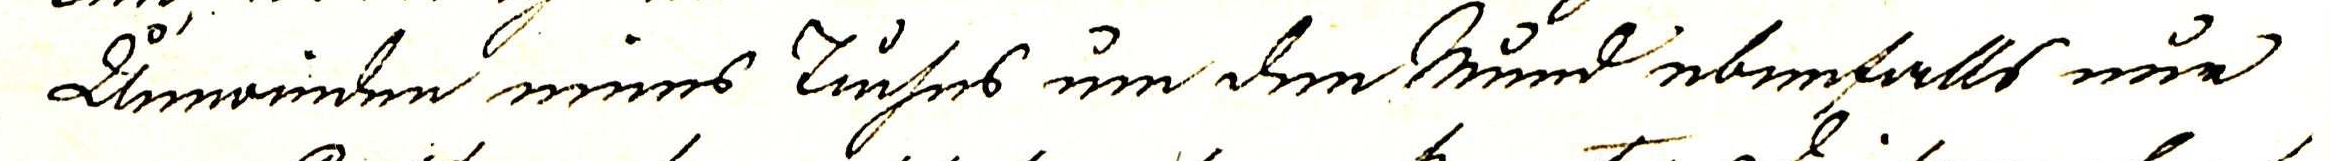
Umwinden eines Tuches um den Mund ebenfalls nur
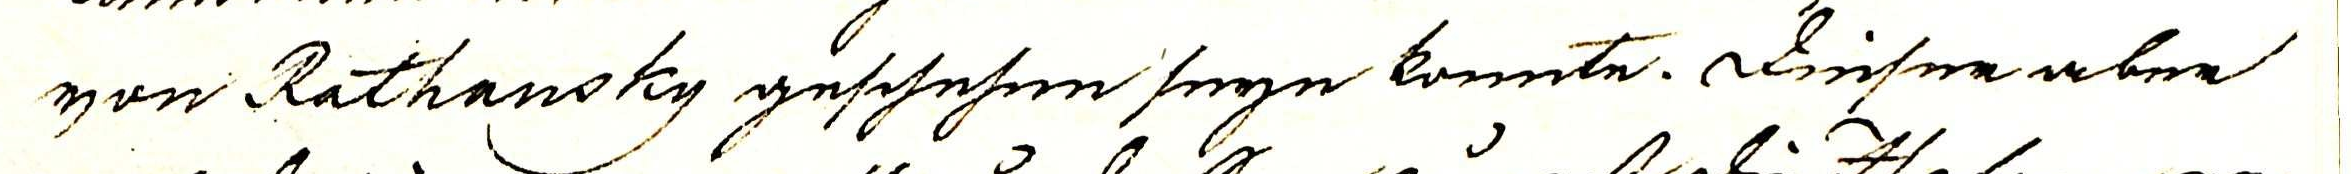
von Rathansky geschehen seyn konnte. Dieser aber
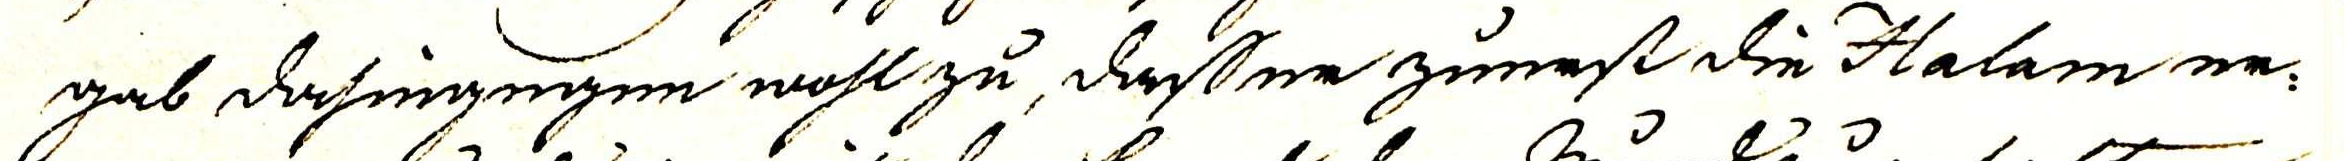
gab dahingegen wohl zu, daß er zuerst die Halam er¬
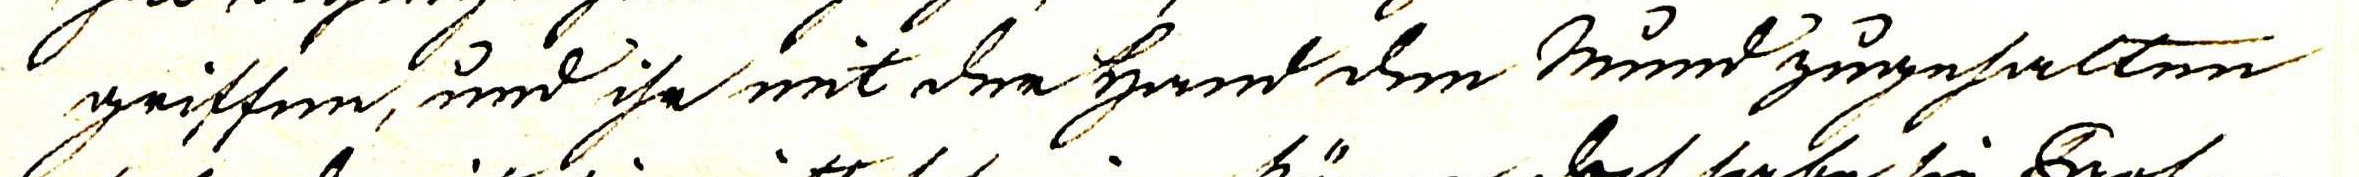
griffen, und ihr mit der Hand den Mund zugehalten
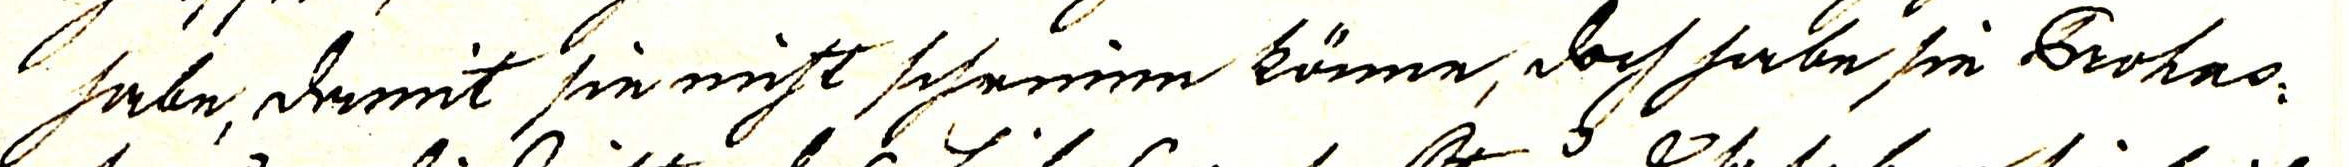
habe, damit sie nicht schreien könne, doch habe sie Prohas¬
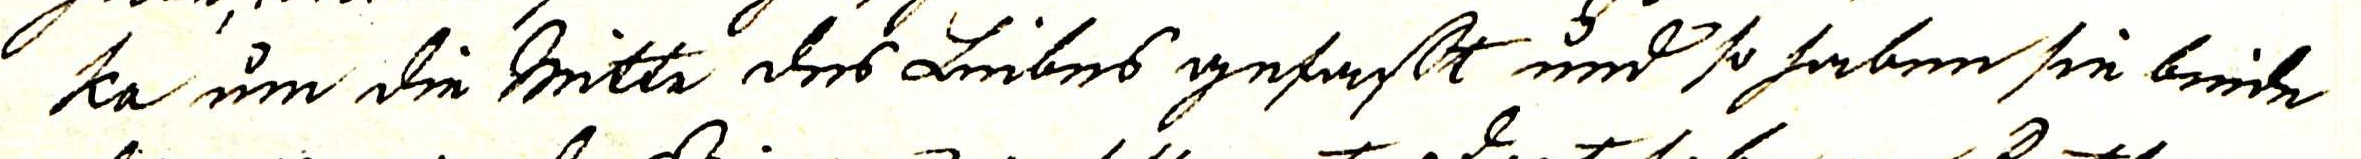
ka um die Mitte des Leibes gefaßt und so haben sie beide
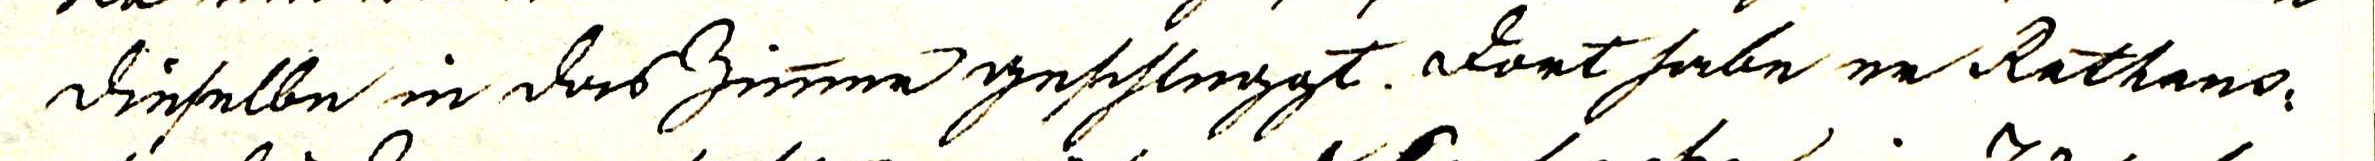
dieselbe in das Zimmer geschleppt. Dort habe er Rathans¬
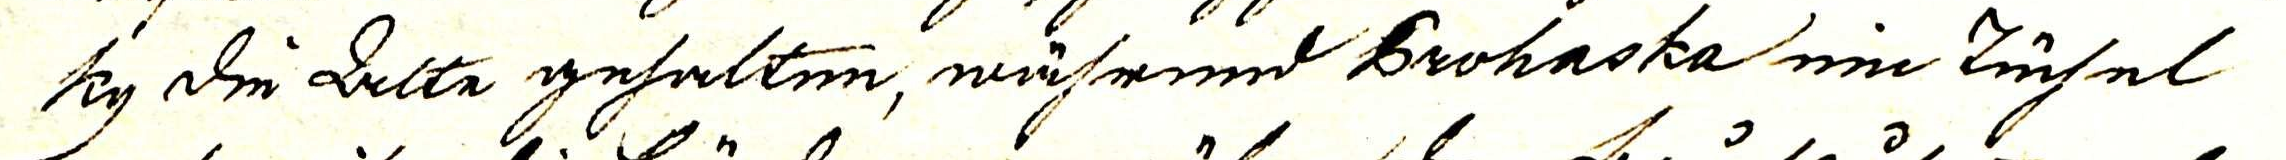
ky die Alte gehalten, während Prohaska ein Tückel
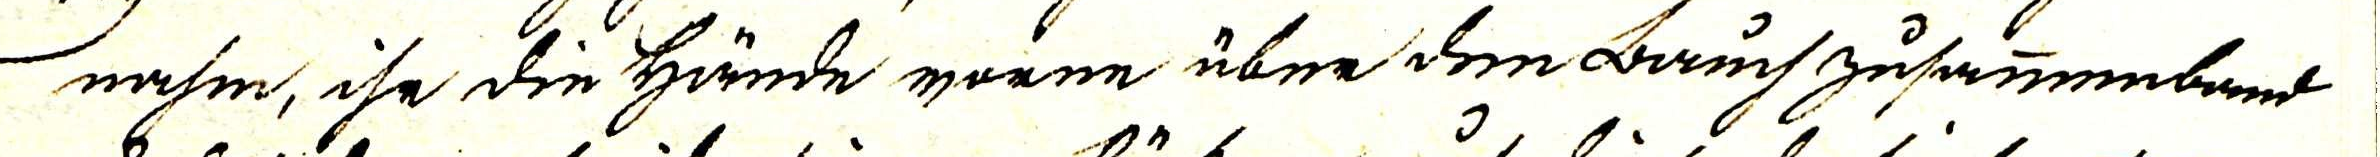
nahm, ihr die Hände vorne über den Bauch zusammenband
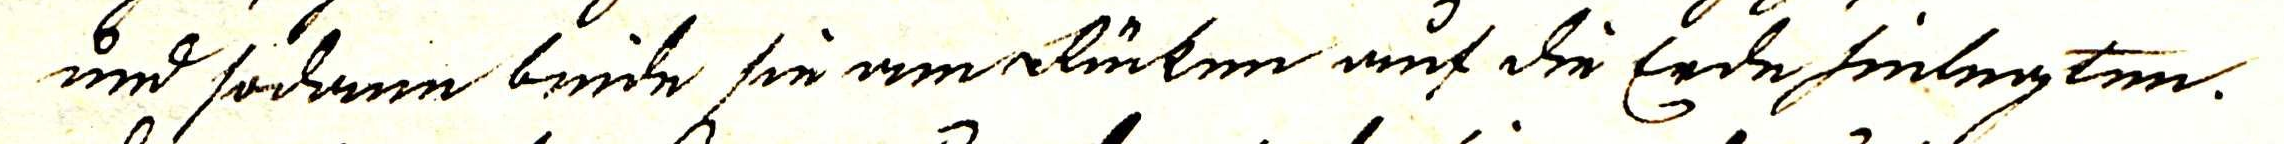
und sodann beide sie am Rücken auf die Erde hinlegten.
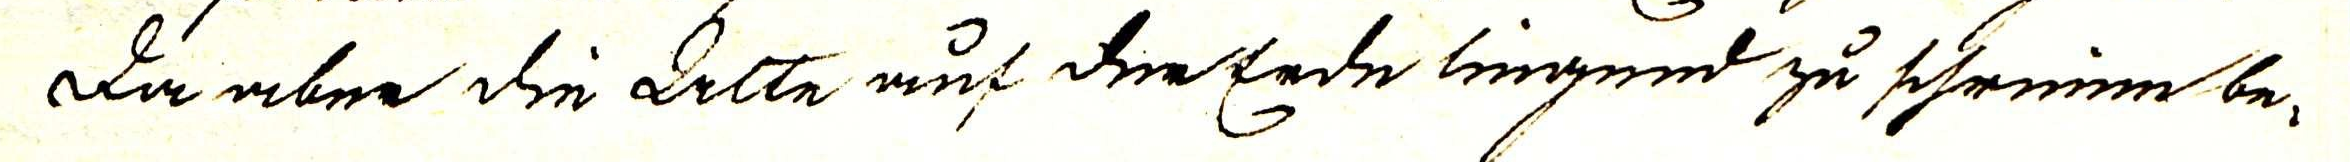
Da aber die Alte auf der Erde liegend zu schreien be¬
